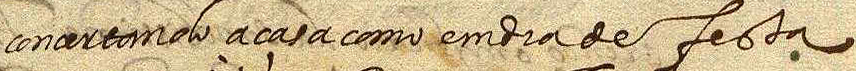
concertando a casa como em dia de festa
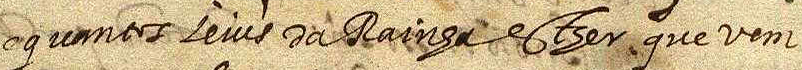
e quantos ieiūs da Rainha esther que vem
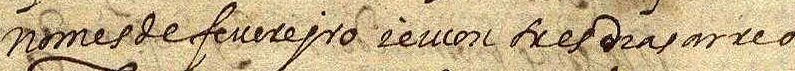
nos mes de feverejro ieiuou tres dias arreo
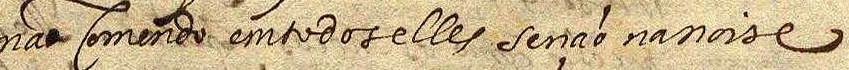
não Comendo em todos elles senaõ na noite
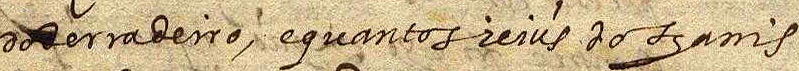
do derradeiro, e quantos ieiūs do thanis
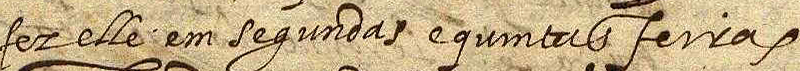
fez elle em segundas e quintas feiras
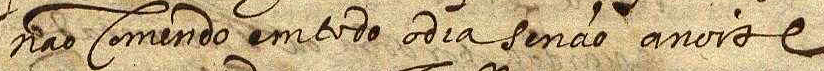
não Comendo em todo o dia senão a noite
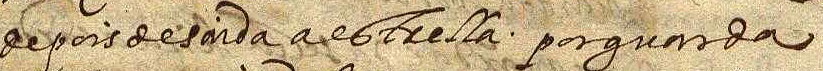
depois de saida a estrella por guarda
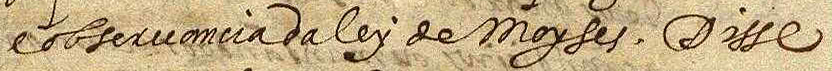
e observancia da ley de moyses. Disse
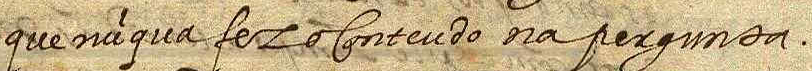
que nūqua fez o Conteudo na pergunta
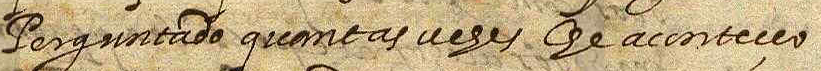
Perguntado quantas vezes lhe aconteçeo
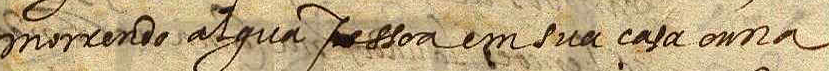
morrendo alguā pessoa em sua casa ou na
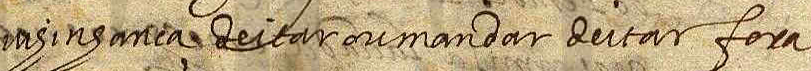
vizinhança deitar ou mandar deitar fora
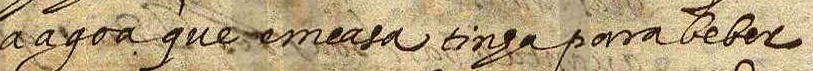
a agoa que em casa tinha para beber
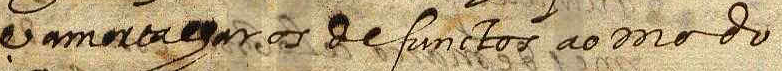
e amortalhar os defunctos ao modo
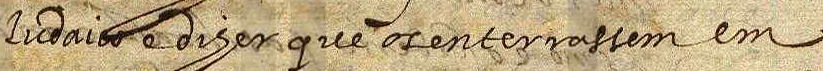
iudaico e dizer que os enterrassem em
